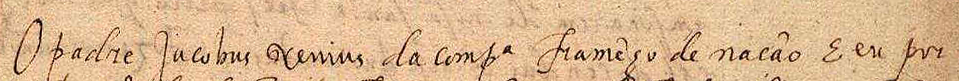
O padre Jacobus Nenius da compa framēgo de nação E eu por
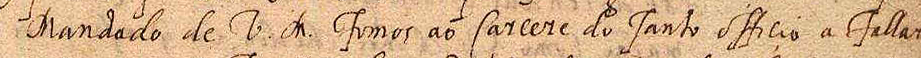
Mandado de V. M. fomos ao Carcere do Santo officio a fallar
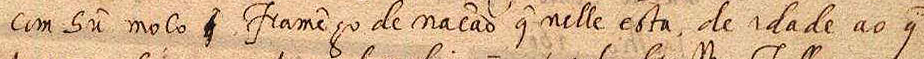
com hū moço q̄ framēgo de nação q̄ nelle esta de idade ao q̄
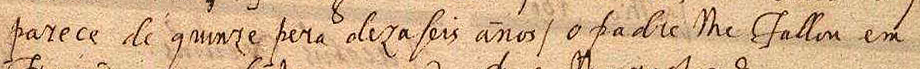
parece de quinze pera dezaseis an̄os / o padre lhe fallou em
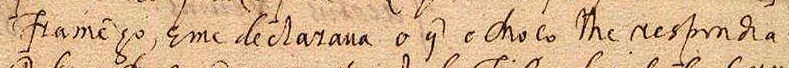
framēgo, E me declaraua o q̄ o Moço lhe respondia.
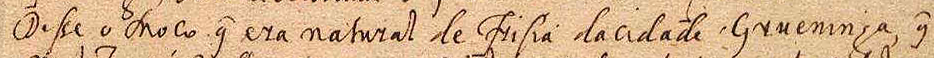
Disse o Moço q̄ era natural de frisia da cidade Grueninga, q̄
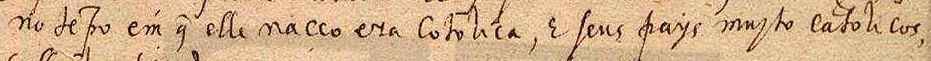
no tēpo em q̄ elle naceo era catolica, E seus pays mujto catolicos,
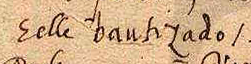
E elle bautizado /
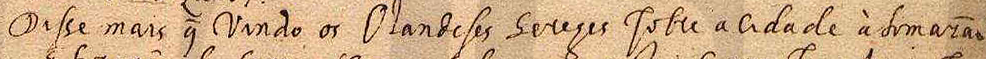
Disse mais q̄ vindo os Olandeses hereges sobre a cidade a tomarão
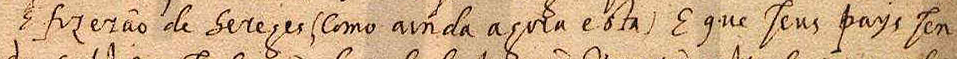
E fizerão de hereges (como ainda agora esta) E que seus pays sen
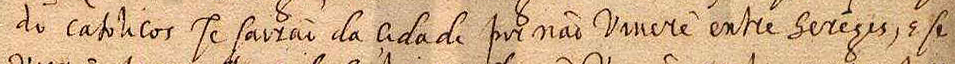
do catolicos se sairaõ da Cidade por não viuerē entre hereges, E se
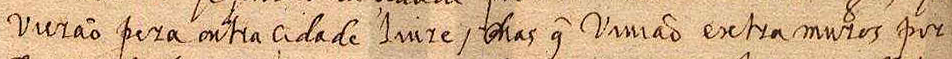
vieraõ pera outra cidade Iiure, Mas q̄ viuiaõ extra muros por
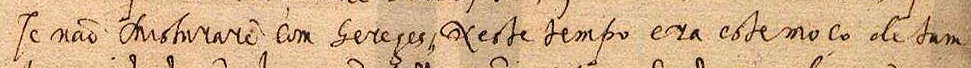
se não Misturarē com hereges, Neste tempo era este moço de tam
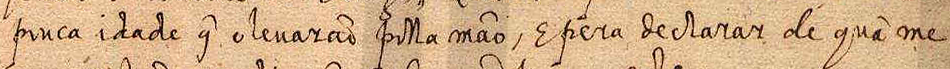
pouca idade q̄ o leuaraõ pella mão, E pera declarar de quā me
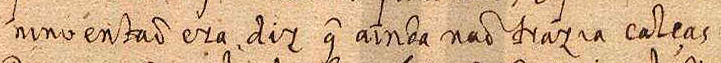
nino entaõ era diz q̄ ainda naõ trazia calças
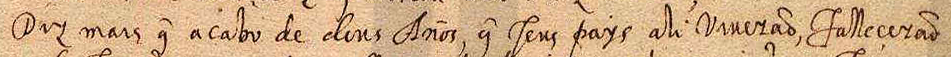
Diz mais q̄ a cabo de dous Anōs, q̄ seus pays ali viuerão, fallecerão
